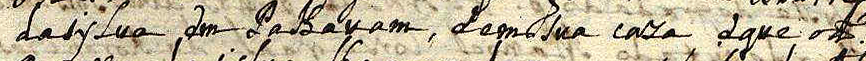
da sylua em Palhauam, e em sua caza e que o d̄.o
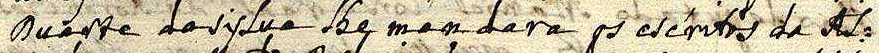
Duarte da sylua lhe mandara os escritos da Al
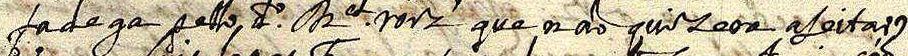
fadega pello d̄.o M.el roiz̄ que naõ quizera aseitar
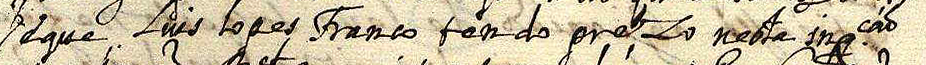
e que Luis lopes Franco tendo prezo nesta inꝗ.çaõ
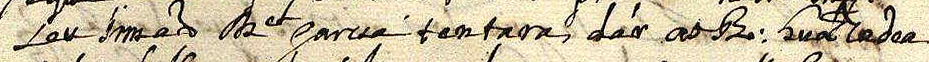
seu Irmaõ Mel Garcia tentara dar ao R. huā cadea
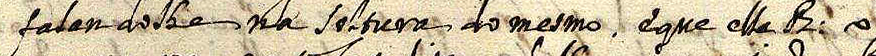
falandolhe na soltura do mesmo, e que elle R: o
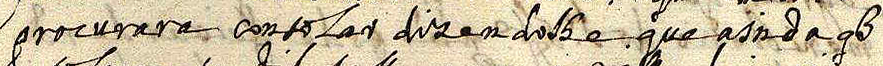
procurara consoLar dizendolhe que ainda q̄
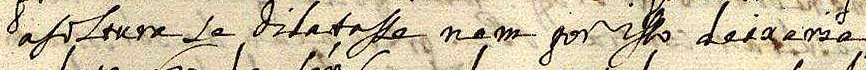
a soltura se dilatasse nem por isso deixaria
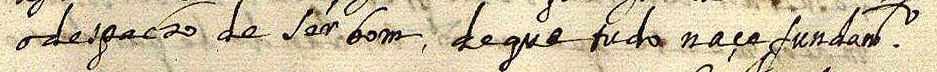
o despacho de ser bom, de que tudo naça fundam.to
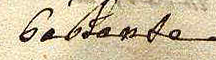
bastante
